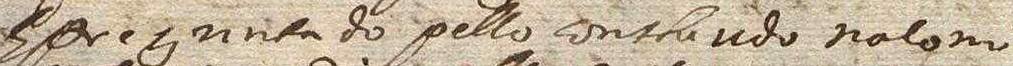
E preguntado pello contheudo na comi
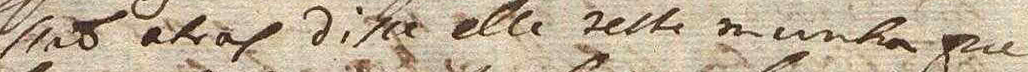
ssaõ atras disse elle testemunha que
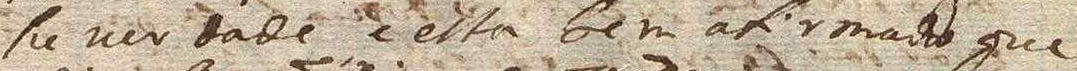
he uerdade, e esta bem afirmado que
